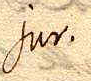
jur.
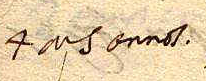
4 ou 5 annos.
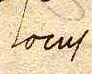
Locus
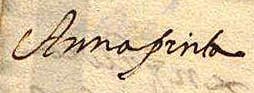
Anna pinta
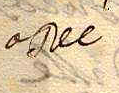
a Ree
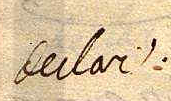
declar ./.
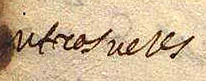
Outras uezes
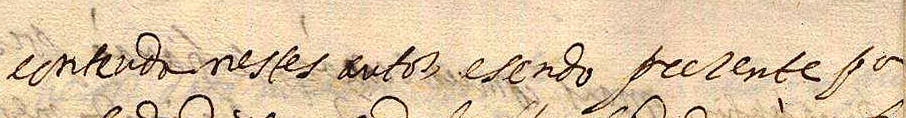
conteuda nestes autos e sendo prezente pa
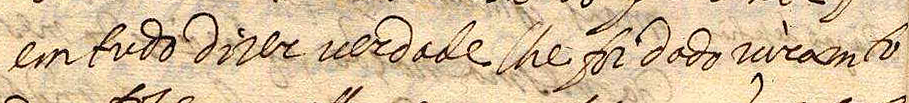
em tudo dizer uerdade lhe foi dado iuramto
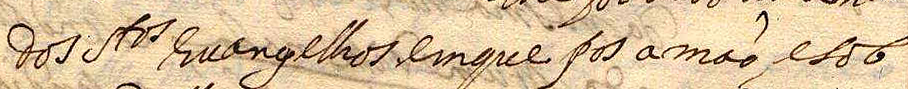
dos stos Euangelhos em que pos a mão, e sob
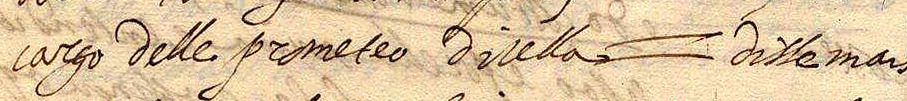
cargo delle prometeo dizella = disse mais
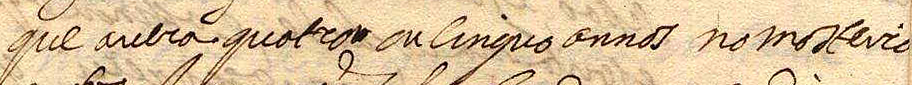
que auera quatro ou cinquo annos no mosteiro
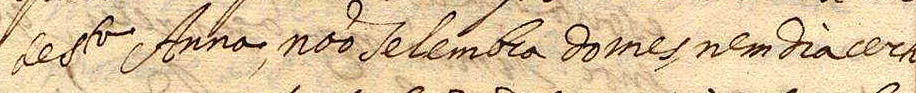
de sta Anna, naõ se lembra do mes, nem dia certo
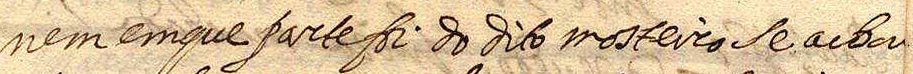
nem em que parte foi do dito mosteiro se achou
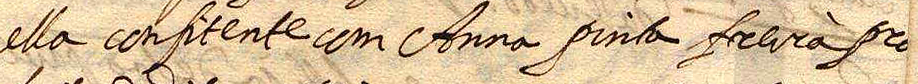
ella confitente com Anna pinta freira pro
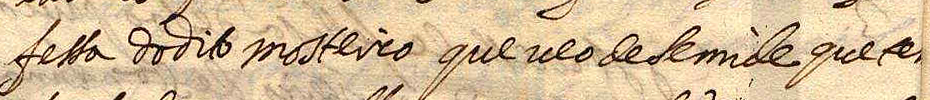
fessa do dito mosteiro que ueo de semide que te
